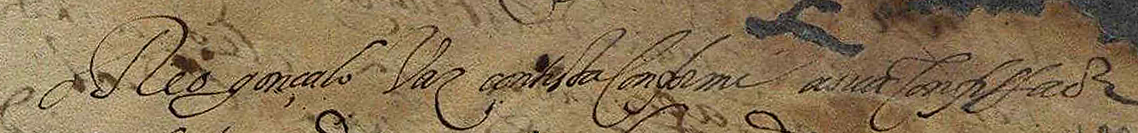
o Reo gonçalo Vaz contesta Conforme a sua Confissaõ
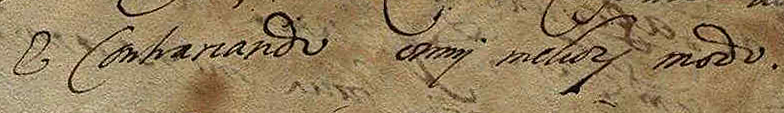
E Contrariando, omnj meliorj modo.
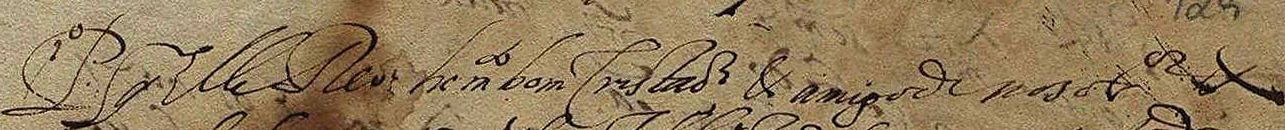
P q̄ Elle Reo he mto bom Cristaõ & amigo de noso sor &
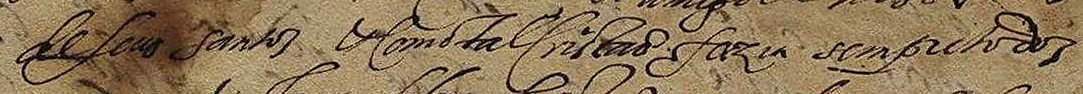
de seus santos, & Como tal Cristaõ fazia sempre todos
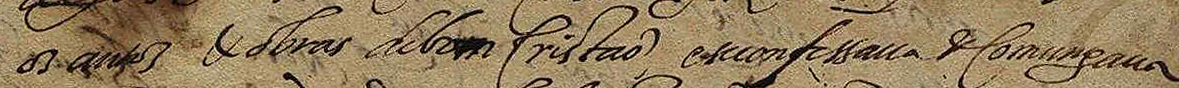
os autos & obras de bom Cristaõ, e se confessaua & Comungaua
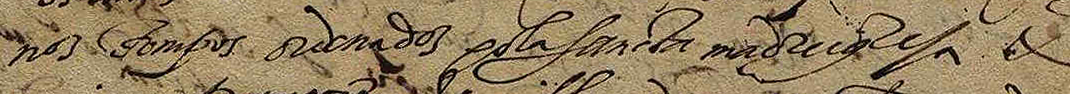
nos tempos ordenados pela sancta madre igreja &
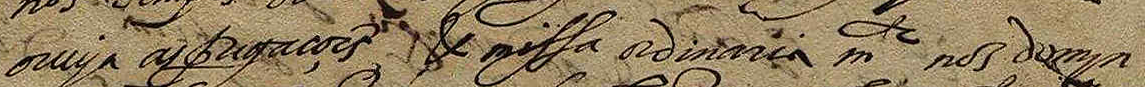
ouuja as pregaçoẽs & missa ordinariamte nos domjn
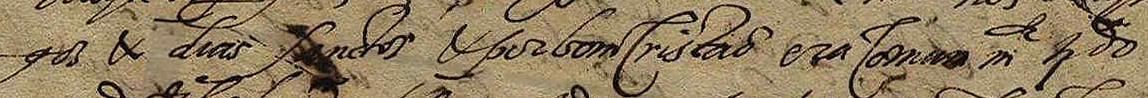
gos & dias sanctos & por bom Cristaõ era Comummte tjdo
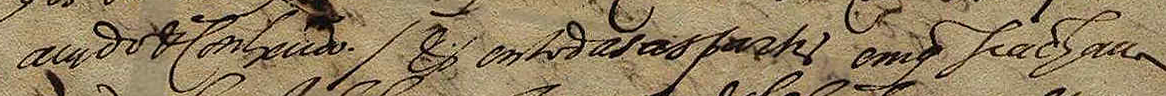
auido & Conhecido / & em todas as partes em q̄ se achaua
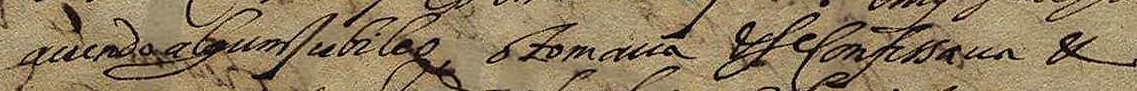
auendo algum Jubileo o tomaua & se Confessaua &
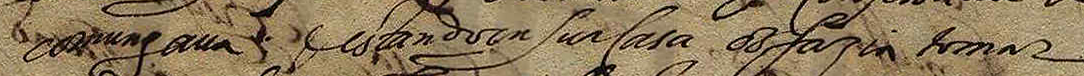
comungaua. & estando en sua Casa os fazia tomar
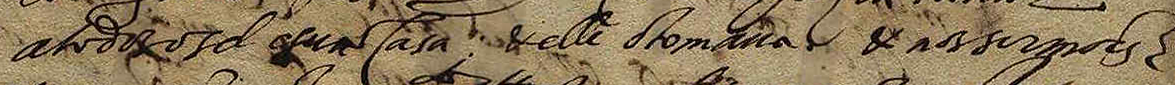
a todos os de sua Casa & elle o tomaua. & nos sermoẽs
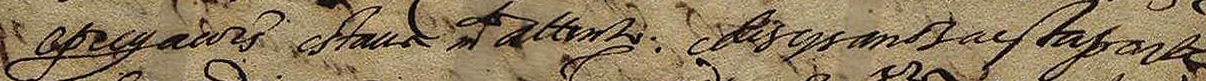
e pregaçoĩs estaua mto attento: e de seis anos a esta parte
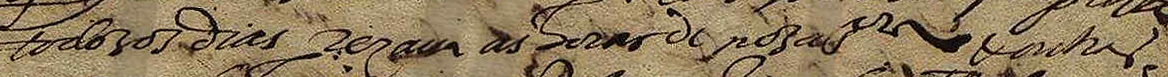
todos os dias rezaua as horas de nosa sra, & outras
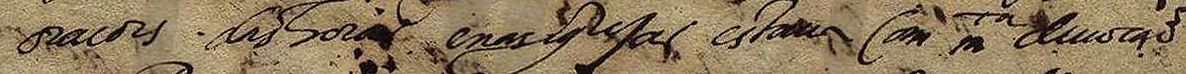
oraçois das horas e nas igrejas estaua Com mta deuoçaõ
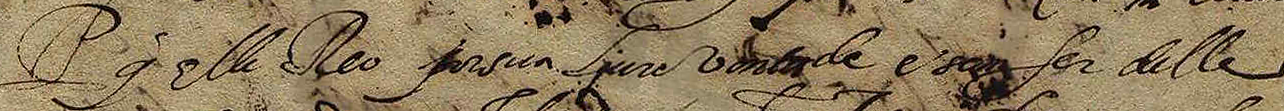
P q̄ Elle Reo por sua liure vontade e sem ser delle
